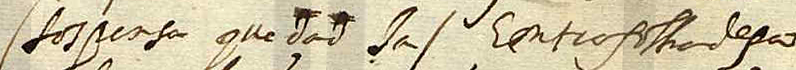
/ sospensa quedaõ Ja / E outra folha de pa
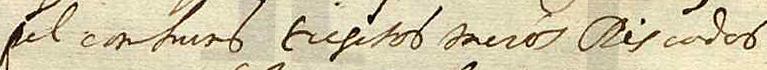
pel con huns tresetos meios Riscados
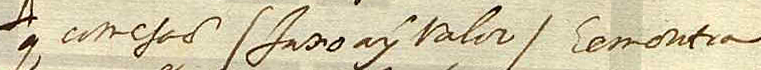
q̄ comesaõ / Ja no ay valor / E em outra
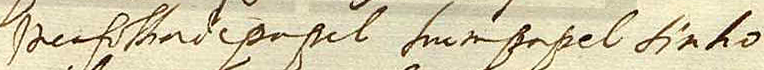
mea folha de papel hum papelsinho
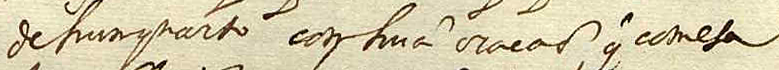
de hun quarto con huā oraçaõ q̄ comesa
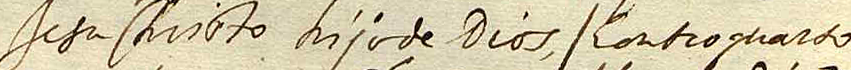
Jesu Christo hijo de Dios, / E outro quarto
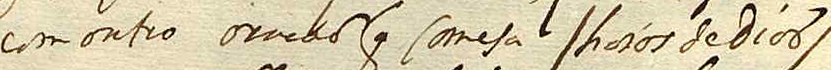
com outro oraçaõ q̄ Comesa / hoios de Dios /
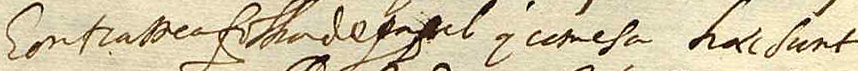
E outra mea folha de papel q̄ comesa hæc sunt
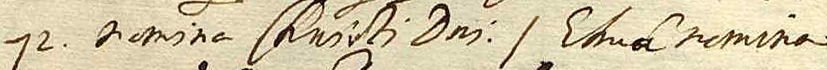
72. nomina Christi Dni. / E huā nomina
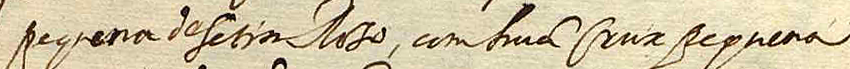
pequena de setin Rozo, com huā Crux pequena
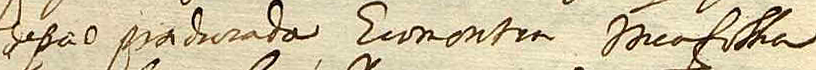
de pao pindurada E com outra mea folha
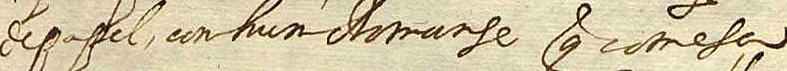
de papel, con hun Romanse q̄ comesa
